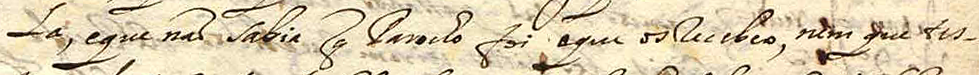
La, e que naõ sabia q̄ Parocho foi o que os Recebeo, nem que tes
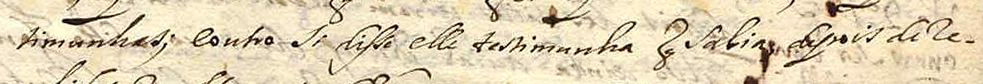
timunhas; e outro si disse elle testimunha q̄ sabia depois de Re
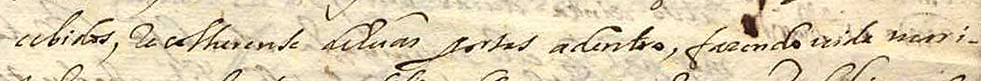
cebidos, Recolherense de huās portas adentro, fazendo uida mari
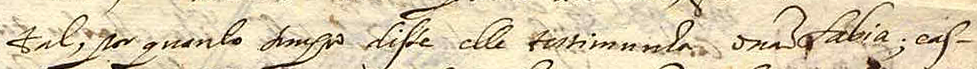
tal, por quanto tempo disse elle testimunha o naõ sabia; e as
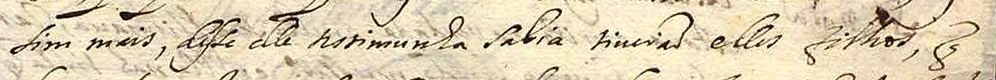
sim mais, disse elle testimunha sabia tiuerão elles filhos, q̄
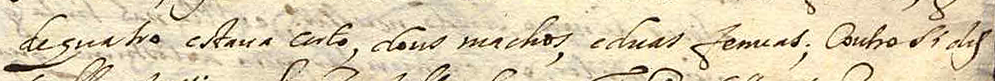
de quatro estaua certo, dous machos, e duas femeas; E outro si dis
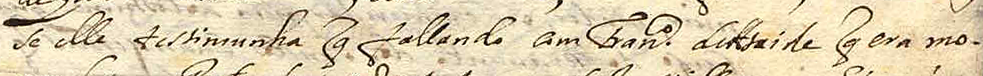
se elle testimunha q̄ fallando com Fran.co de Ataide q̄ era mo
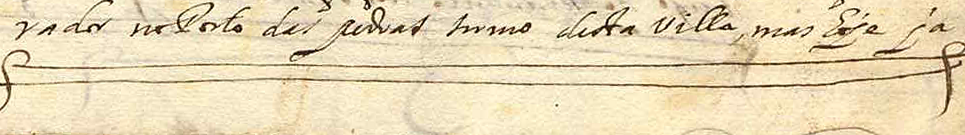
rador no Porto das pedras termo desta villa, mas hoje ja
